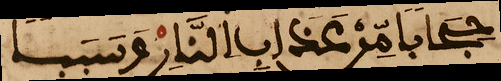حجابا من عذاب النار وسببا
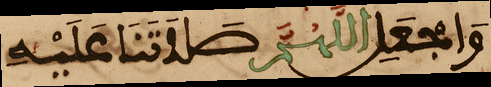واجعل اللهم صلاتنا عليه
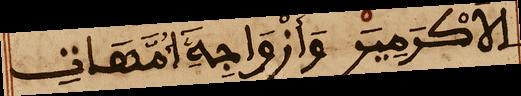الاكرمين وأزواجه امهات
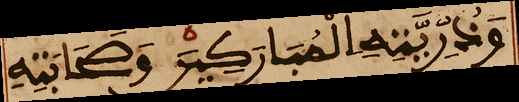وذريته المباركين وصحابته
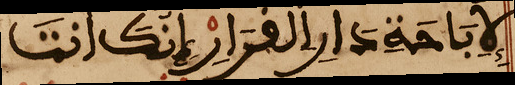لإباحة دار القرار إنك انت
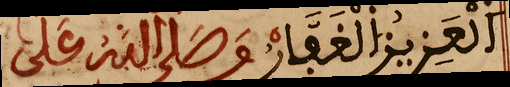العزيز الغفار وصلى الله على
